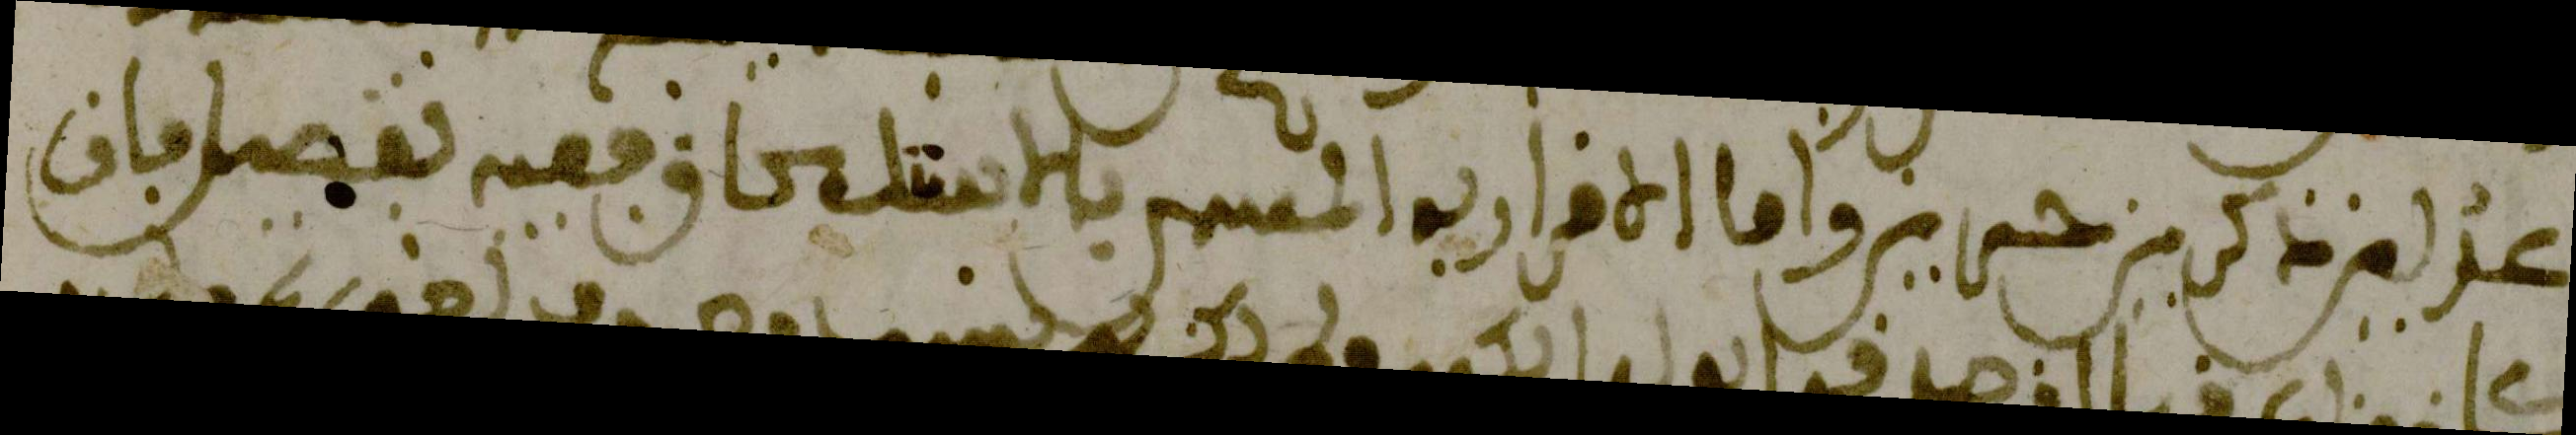عدلين ذكرين حرين واما الاقرار المسمى بالاستلحاق ففيه تفصيل فان
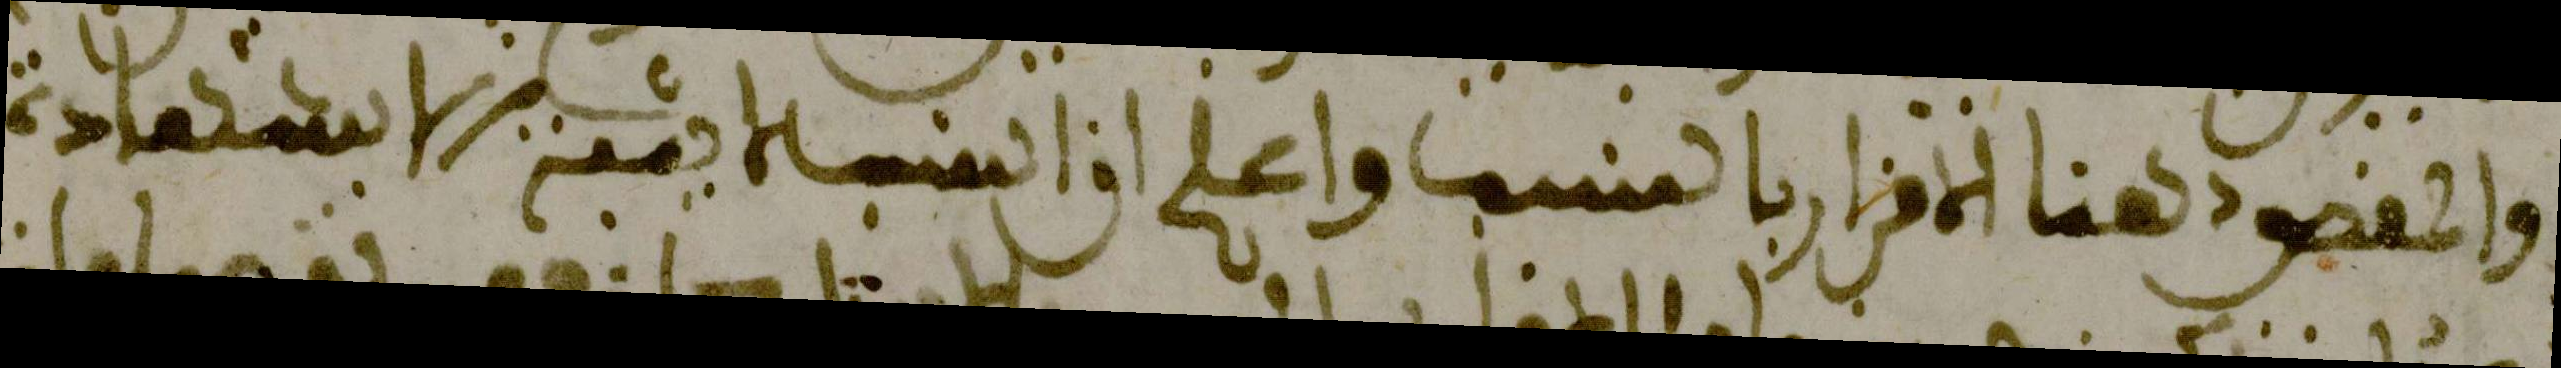والمقصود هنا الاقرار بالنسب واعلم ان النسب لا يثبة الا بشهادة
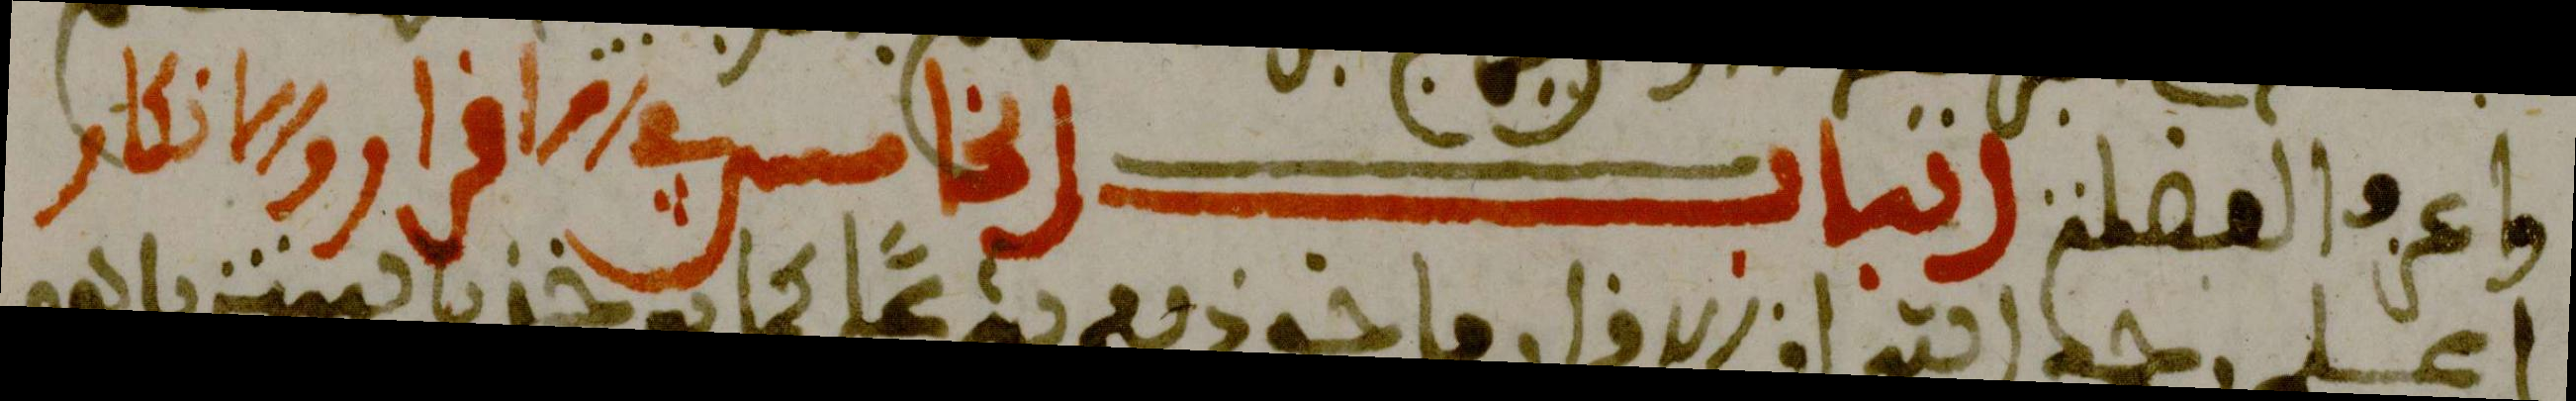واعرف الفضلة البابَ الخامس في الاقرار والانكار
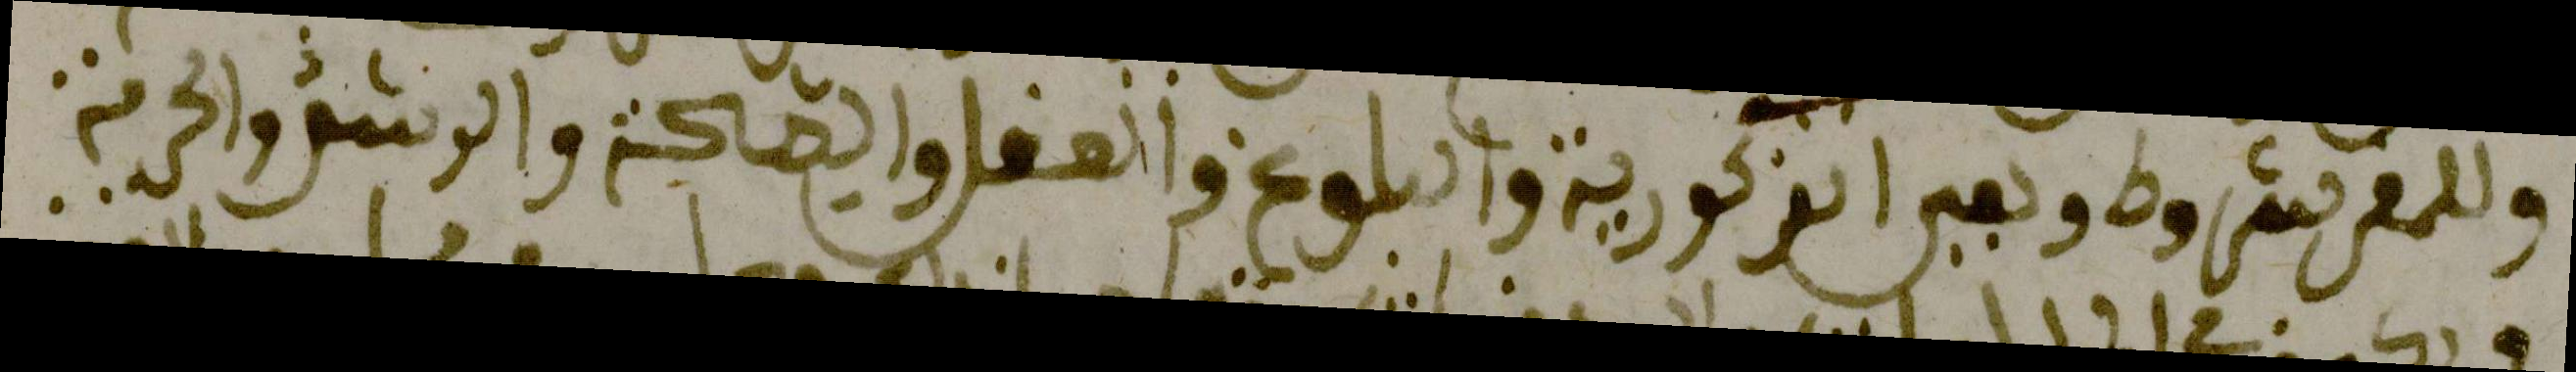وللمقر شروط وهي الذكورة والبلوغ والعقل والصّحة والرشد والحرية
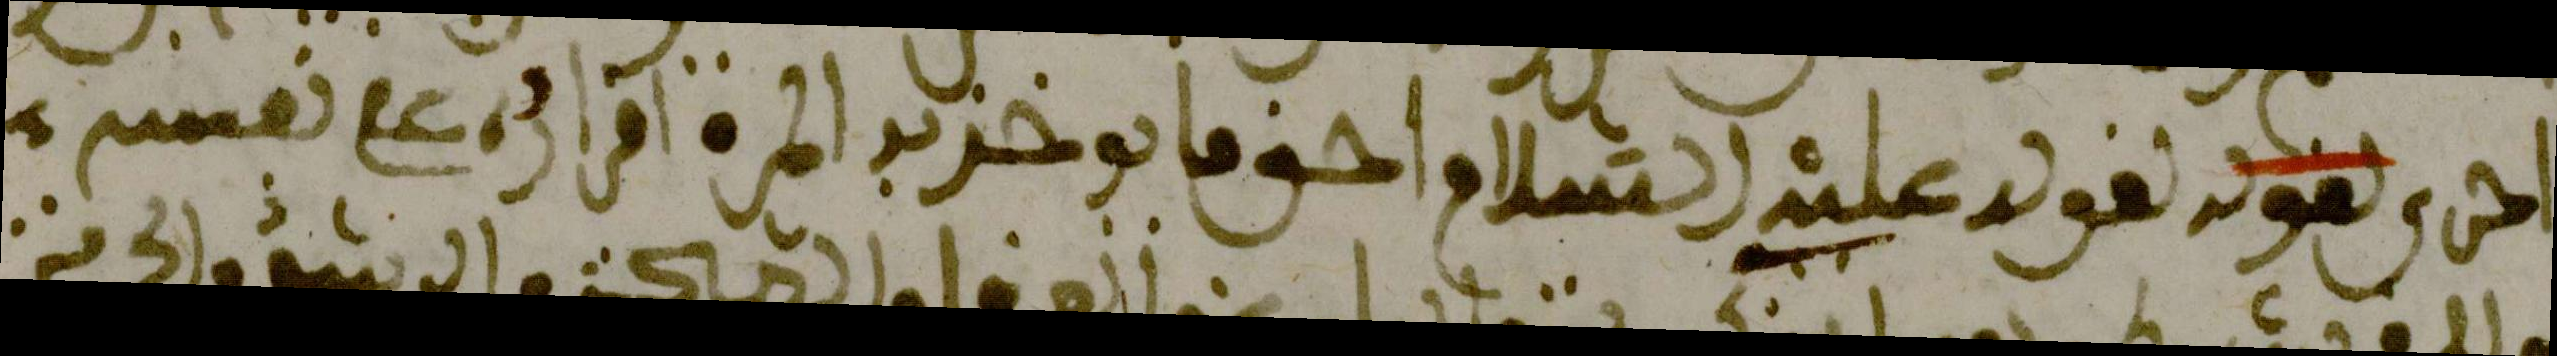احرى لقوله لقوله عليْه السَّلام احق ما يوخذ به المرة اقرارُه على نفسه
